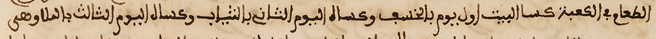الطعام في الكعبة كسا البيت اول يوم بالخسف وكساه اليوم الثانى بالثياب وكساه اليوم الثالث بالملا وهى
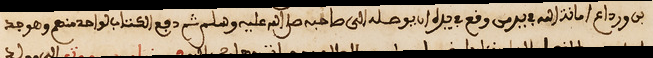بن ورداع امانة الله في يد من وقع في يده ان يوصله الى صاحبه صلى الله عليه وسلم ثم دفع الكتاب لواحد منهم وهو جد
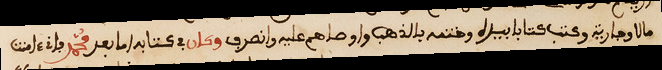مالا وجارية وكتب كتابا بيده وختمه بالذهب و اوصاهم عليه وانصرف وكان في كتابه اما بعد محمّد فانى ءامنت
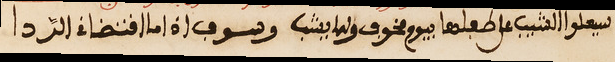سيعلوا الشيب على طفلها بيوم مخوف ولها يشب وسوف اذا ما اقتضانى الرّدا
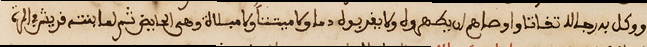ووكل به رجالا تقاتاوا وصاهم ان يطهروه ولا يقربوه دما ولا ميتتاً ولا مبلاة وهى الحايض ثم لما بنته قريش في المرة
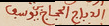الدباج الحجاج يوسف
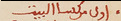ءاول من كسا البيت
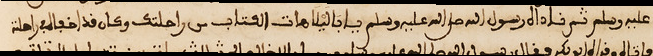عليه وسلم ثم ناداه رسول الله صلى الله عليه وسلم يا با ليلا هات الكتاب من راحلتك وكان قد اخفاه في راحلته
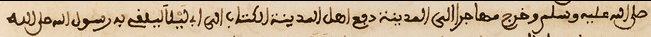صلى الله عليه وسلم وخرج مهاجرا الى المدينة دفع اهل المدينة الكتاب الى ابي ليلا ليلقى به رسول الله صلى الله
